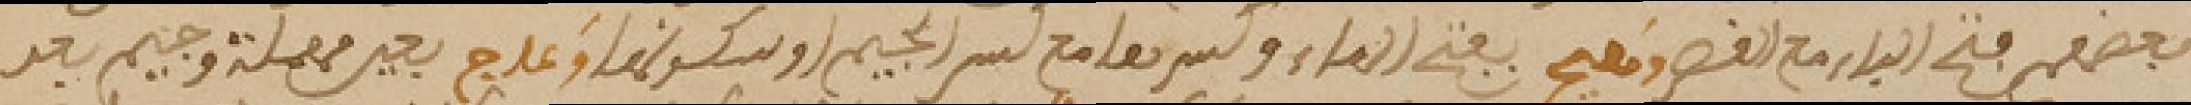بعضهم فتح الباء مع القصر وهيج بفتح الهاء وكسرها مع كسر الجيم وسكونها وعاج بعين مهملة وجيم بعد
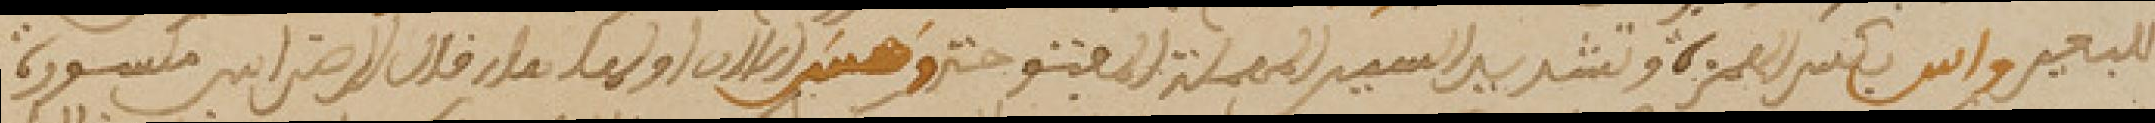للبعير واس بكسر الهمزة وتشديد السين المهملة المفتوحة وهس الا ان أولها هاء قال الرضى اس مكسورة
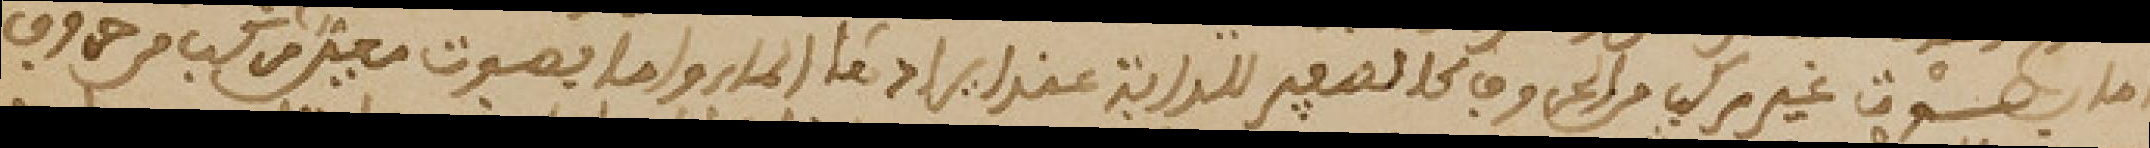اما بصوت غير مركب من الحروف كالصفير للدابة عند ايرادها الماء واما بصوت معين مركب من حروف
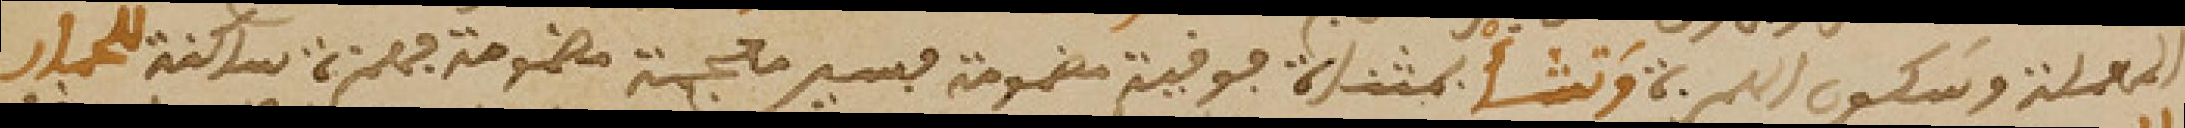المهملة وسكون الهمزة وتشأ بمثناة فوقية مضمونة فسين معجمة مضمومة فهمزة ساكنة للحمار
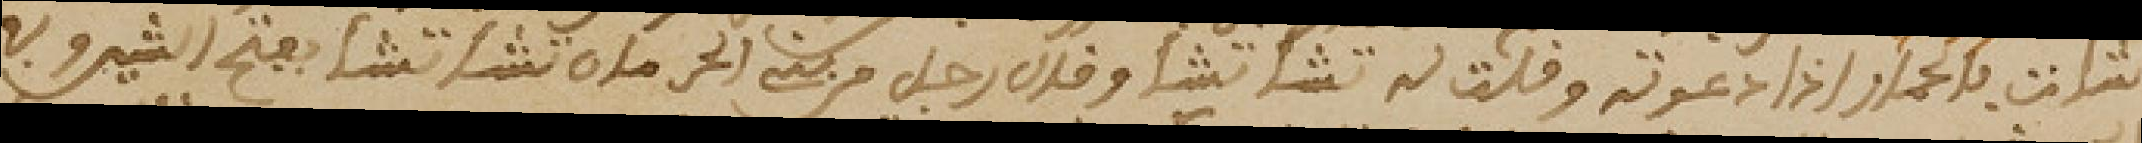شأت بالحمار اذا دعوته وقلت له تشأ تشأ وقال رجل من بني الحرمان تشأ تشأ بفتح الشين وفي
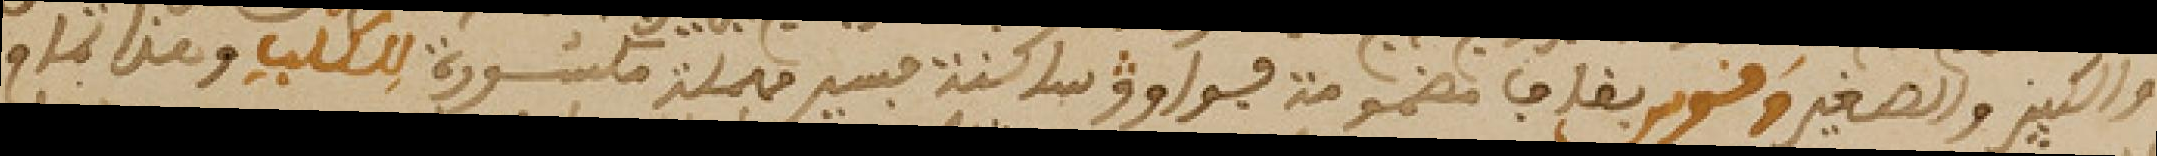والكبير والصغير وقوس بقاف مضمومة فواو ساكنة فسين مهملة مكسورة للكلب وهذا تمام
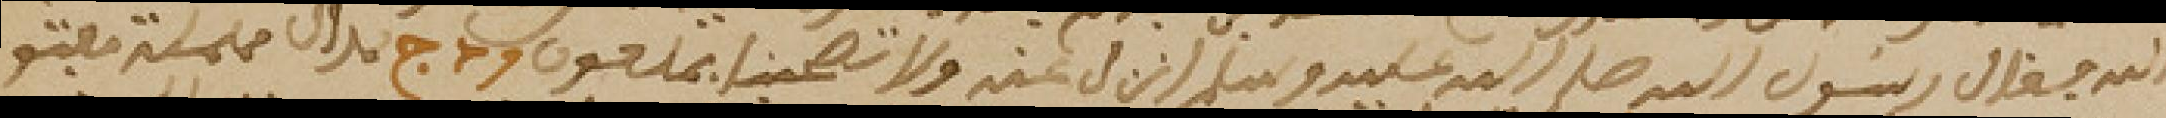الله فقال رسول الله صلى الله عليه وسلم انزل عنه ولا تصحبنا بملعون ودج بدال مهملة مفتو
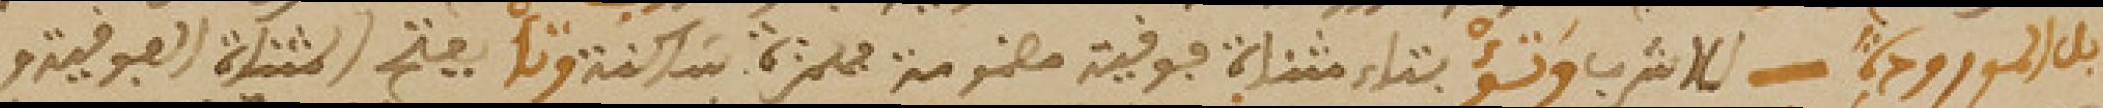بل المورودة # للاشرب وتؤ بتاء مثناة فوقية مضمومة فهمزة ساكنة وتأ بفتح المثناة الفوقية و
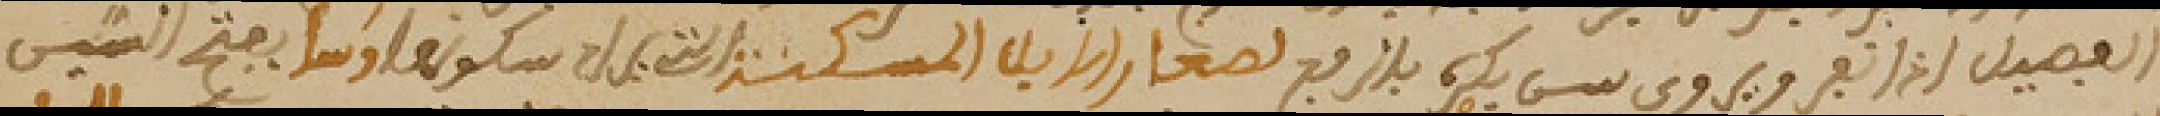الفصيل اذا نفرويروي سن بكره بالرفع لصغار الابل المسكنة التي يراد سكونها وسأ بفتح السين
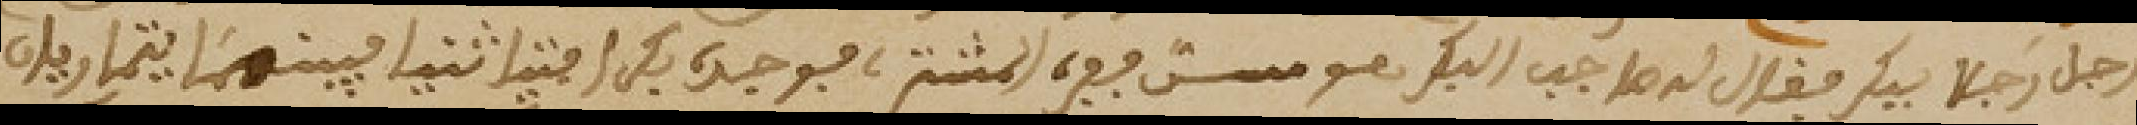رجل رجلا ببكر فقال له صاحب البكر هو مسن ففره المشتري فوجده بكرا فتياثنيا فبينهما يتماريان
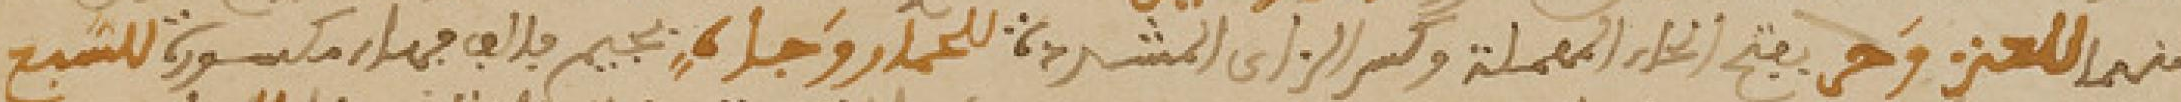منهما للعتر وحر بفتح الحاء المهملة وكسر الزاي المشددة للحمار وجاه بحيم فالف فهاء مكسورة للسبع
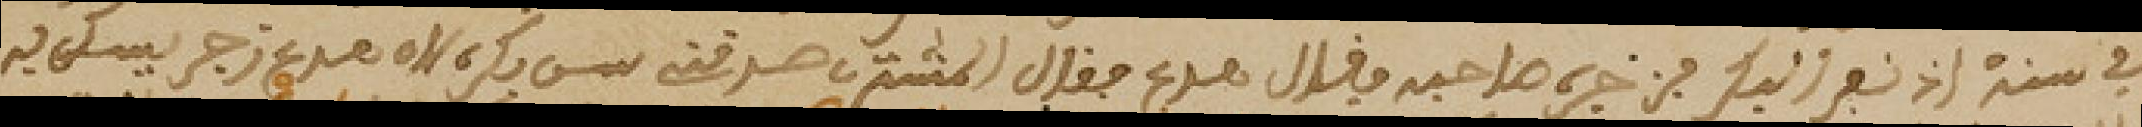في سنه اذ نفر البكر فزجره صاحبه فقال هدع فقال المشتري صدقني سن بكره لان هدع زجر يسكن به
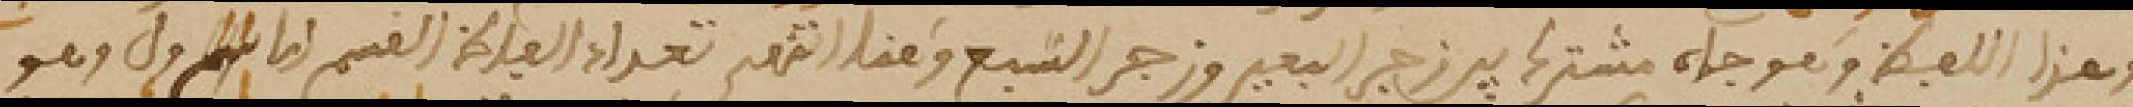وهذا اللفظ وهو جاه مشترك بين زجر البعير وزجر السبع وهنا انتهي تعداد الفاظ القسم الا#ول وهو
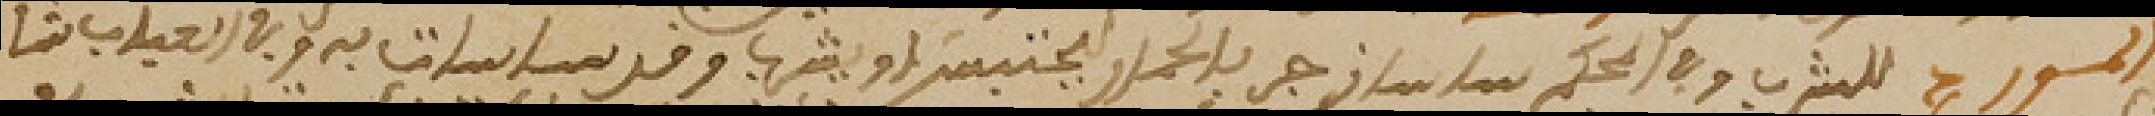المورد للشرب وفي المحكم ساسا زجر بالحمار ليحتبس ويشرب وقر ساسات به وفي العياب شا
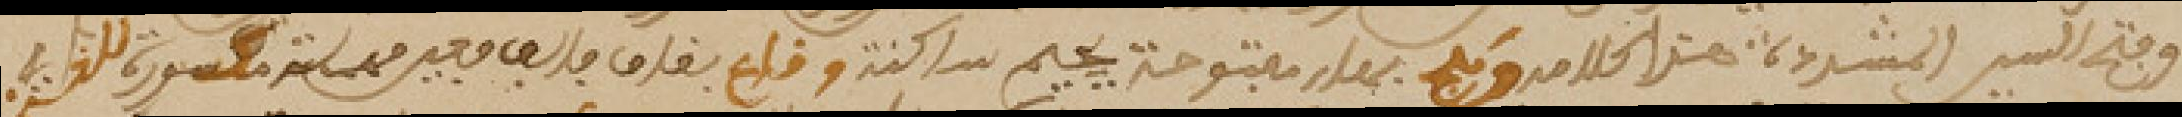وفتح السين المشددة هكذا كلامه وهج بهاء مفتوحة بجيم ساكنة وقاع بقاف فالف فعين مهملة مكسورة للغنم
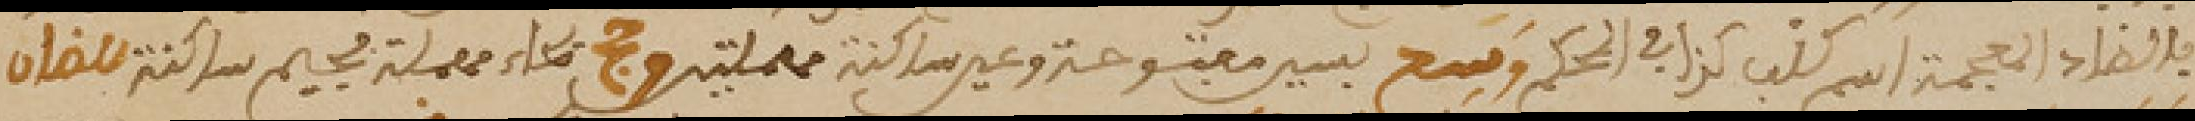بالضاد المعجمة اسم كلب كذا في المحكم وسع بسين مفتوحة وعين ساكنة مهملتين وحج بحاء مهملة فجيم ساكنة للضان
